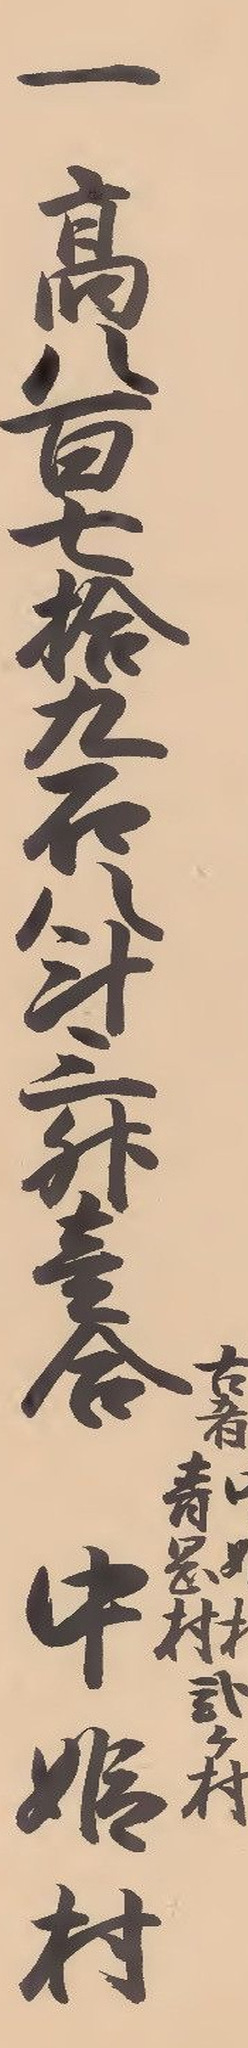一高三百七拾九石壱斗四升六合姫浜村
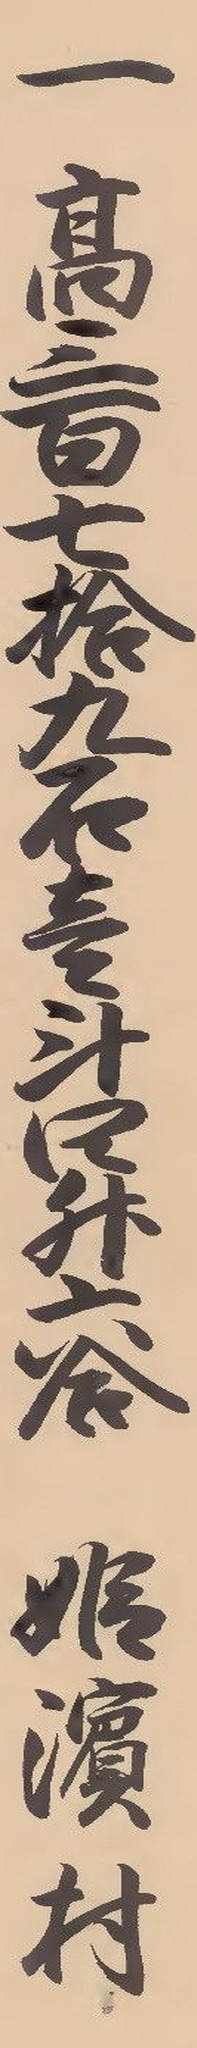一高三百七拾九石壱斗四升六合姫浜村
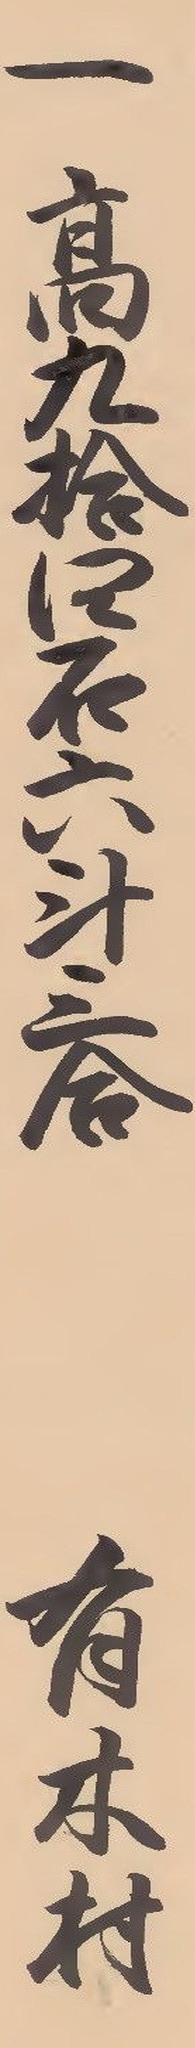一高九拾四石六斗三合有木村
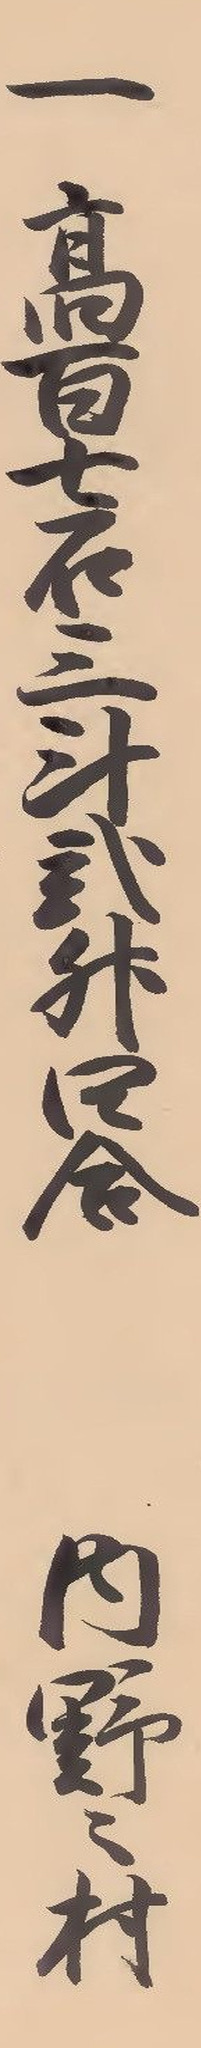一高百七石三斗弐升四合内野々村
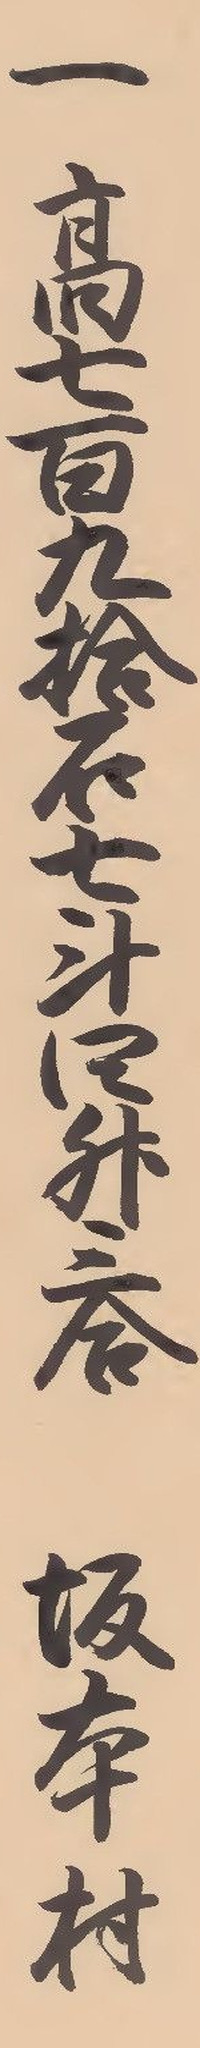一高七百九拾石七斗四升三合坂本村
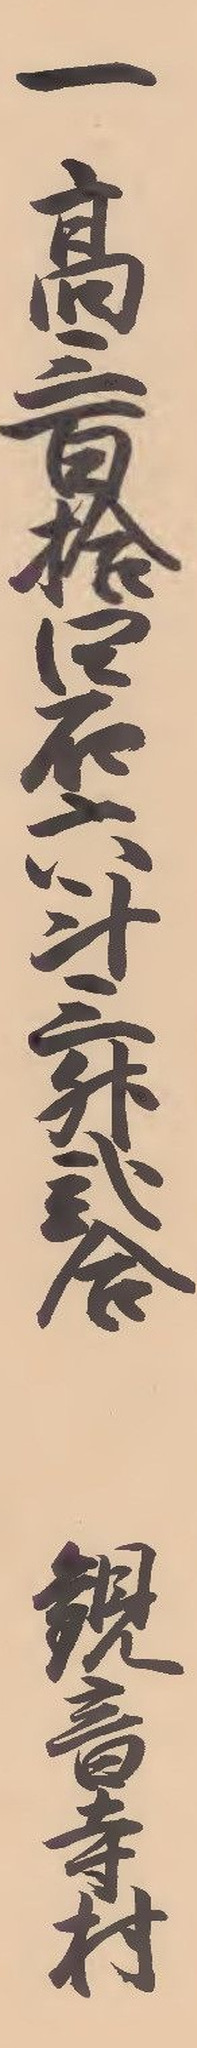一高三百拾四石六斗三升弐合観音寺村

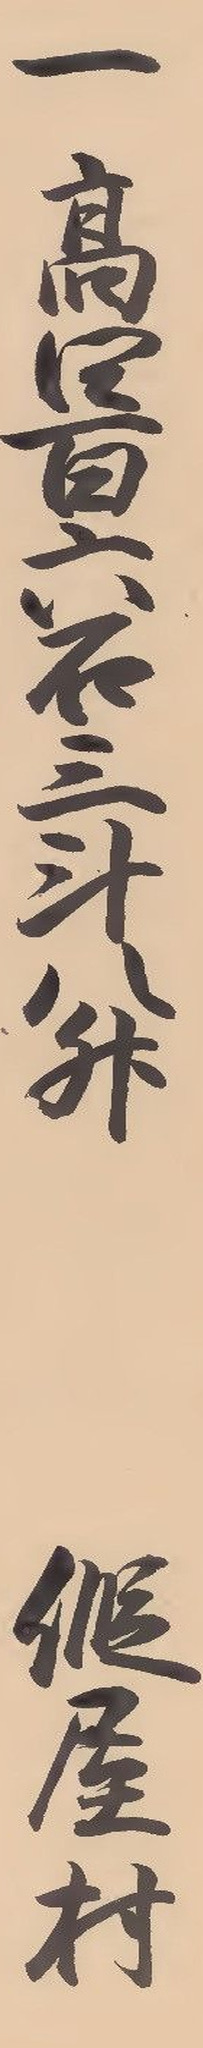一高四百六石三斗八升仮屋村
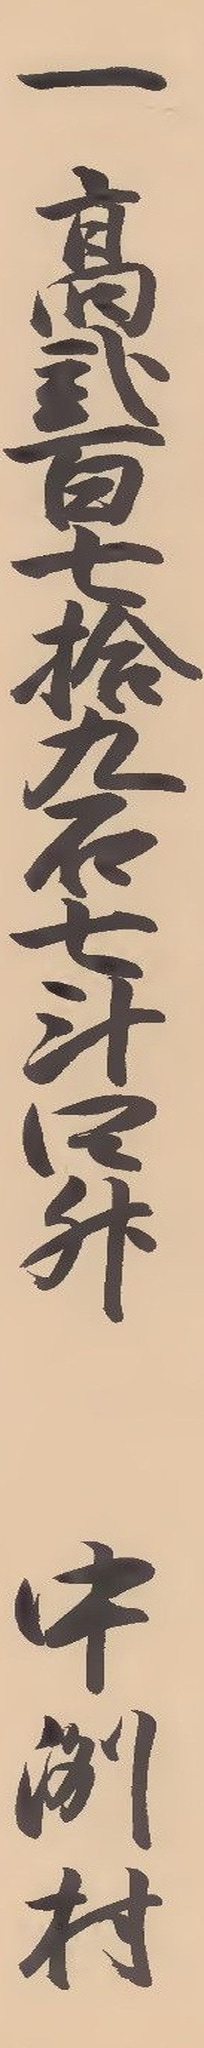一高弐百七拾九石七斗四升中洲村
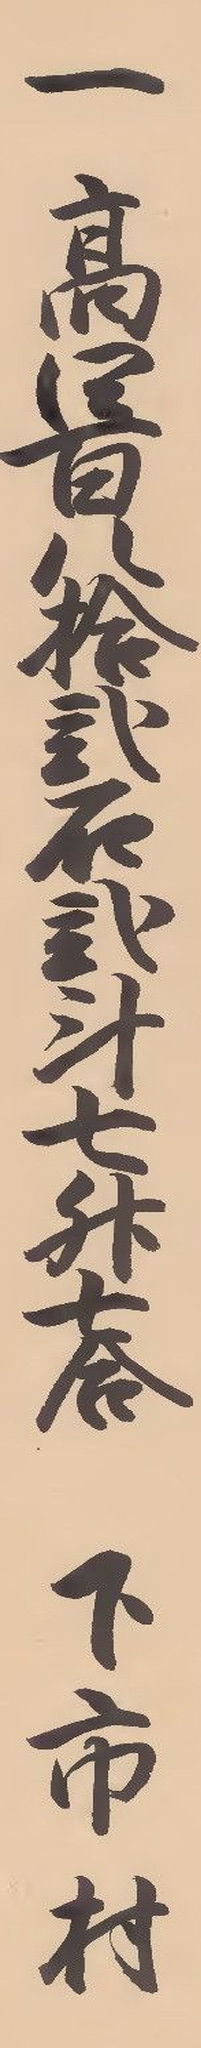一高四百八拾弐石弐斗七升七合下市村
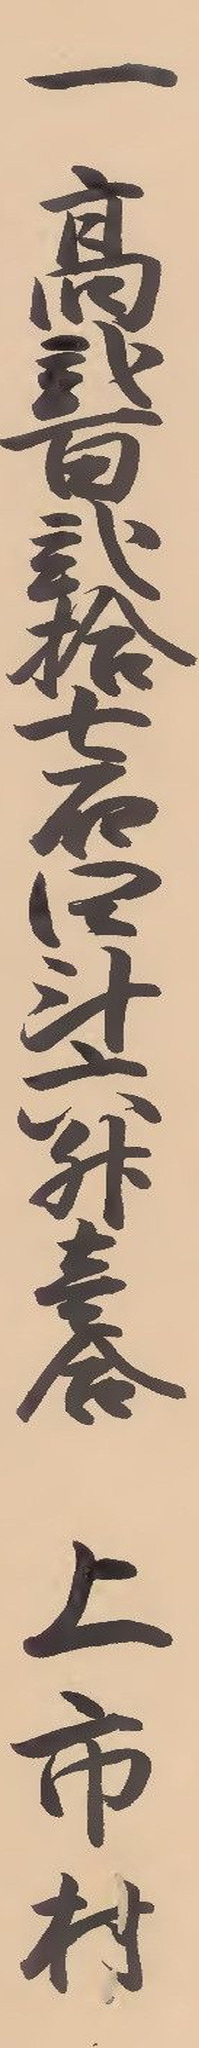一高弐百弐拾七石四斗六升壱合上市村
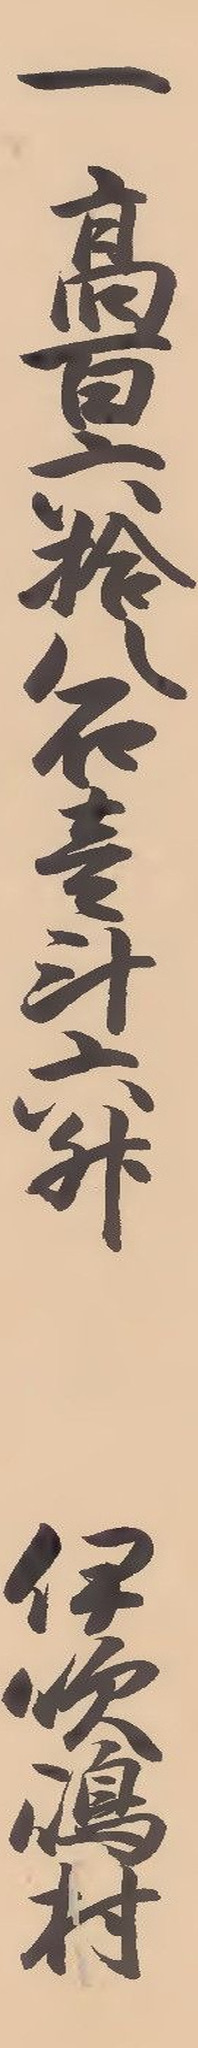一高百六拾八石壱斗六升伊吹島村
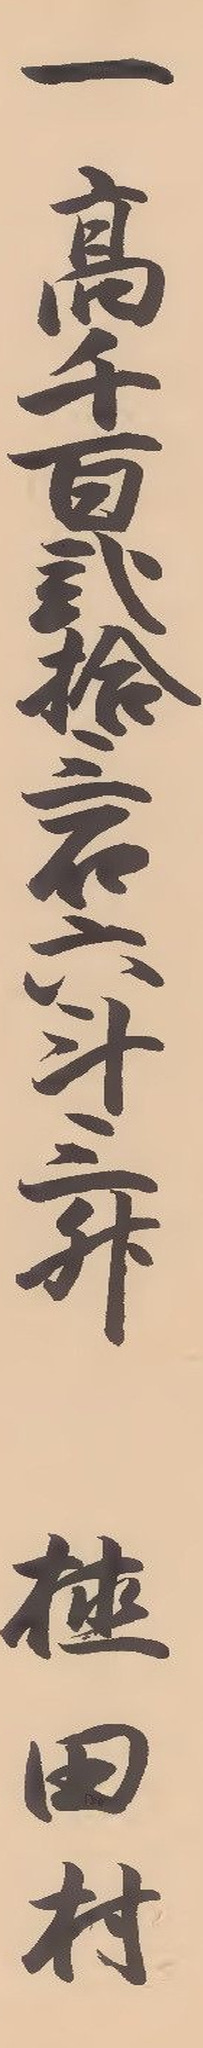一高千百弐拾三石六斗三升植田村
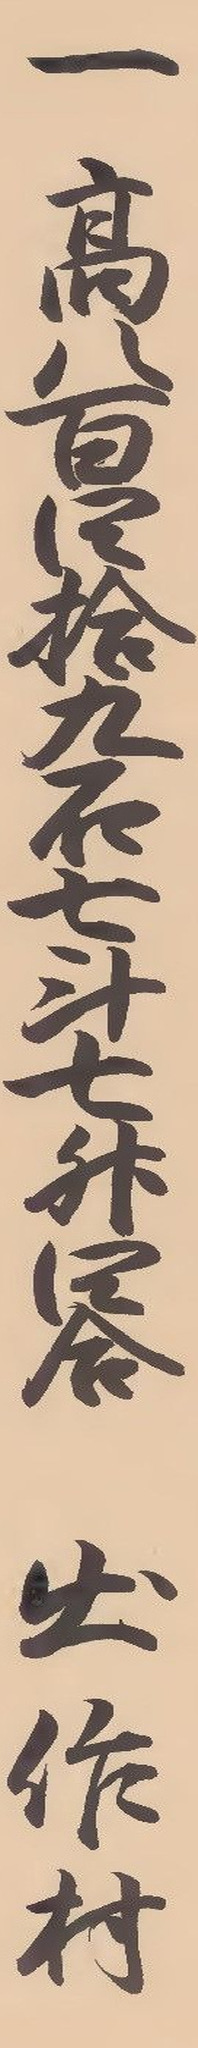一高八百四拾九石七斗七升四合出作村

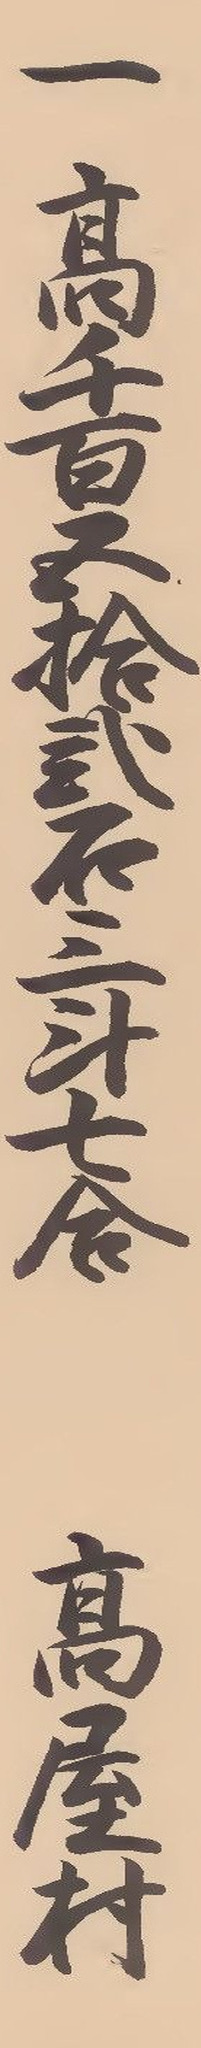一高千百五拾弐石三斗七合高屋村
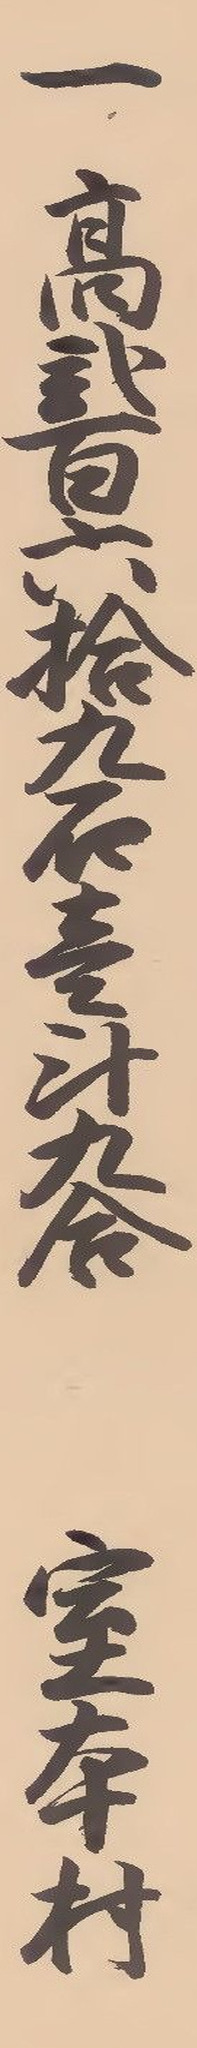一高弐百六拾九石壱斗九合室本村
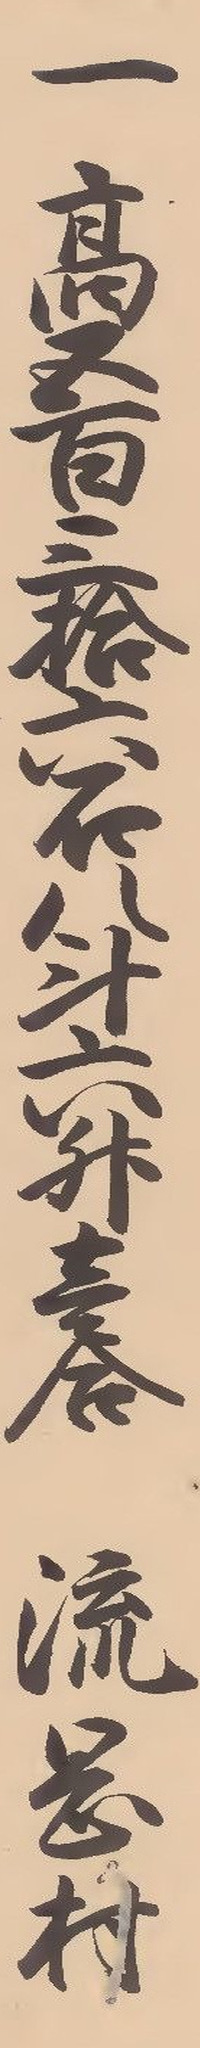一高五百三拾六石八斗六升壱合流岡村
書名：讃岐国郷帳
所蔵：国立公文書館 National Archives of Japan
